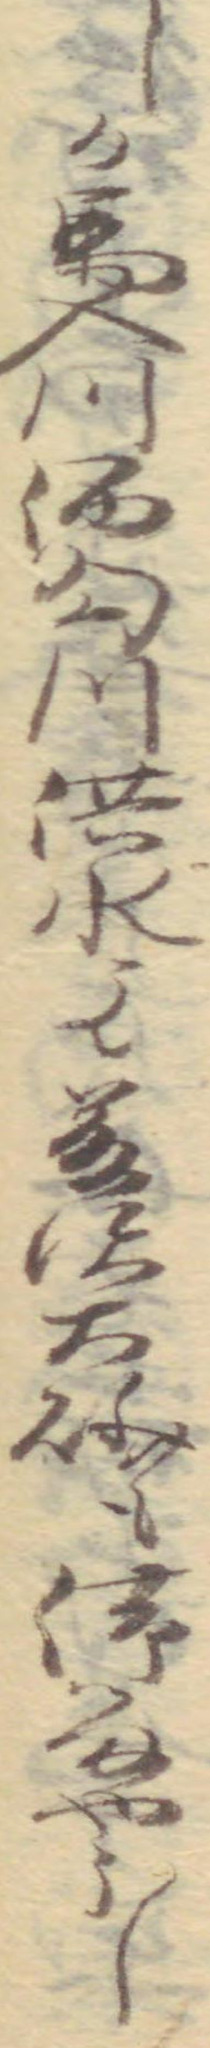しか馬入川酒匂川洪水ニて藤沢大磯も滞留やう〳〵
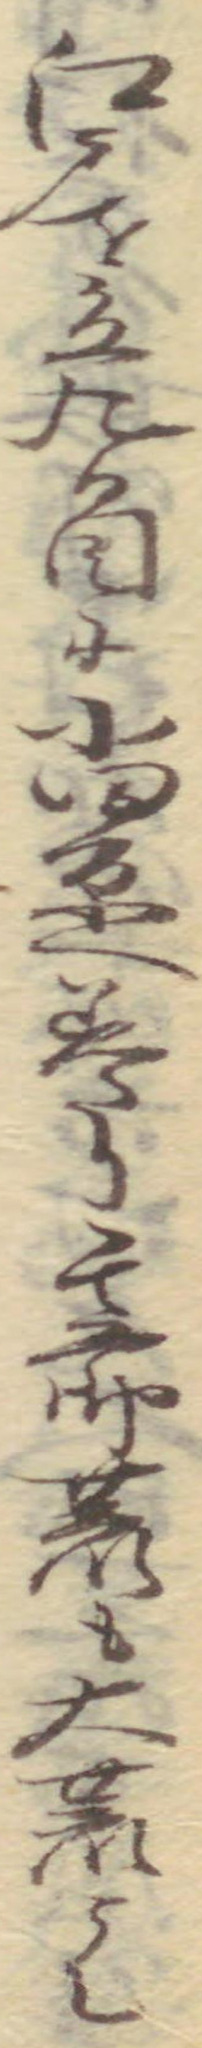江戸を立九日目に小田原へ着たり其筋荒も大荒ニて
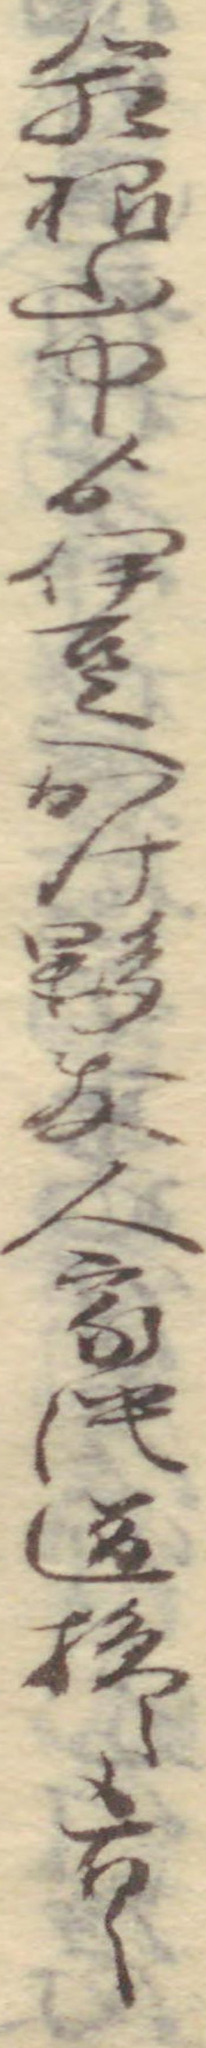箱根山中ゟ伊豆へかけ夥敷人家潰道損候も有之
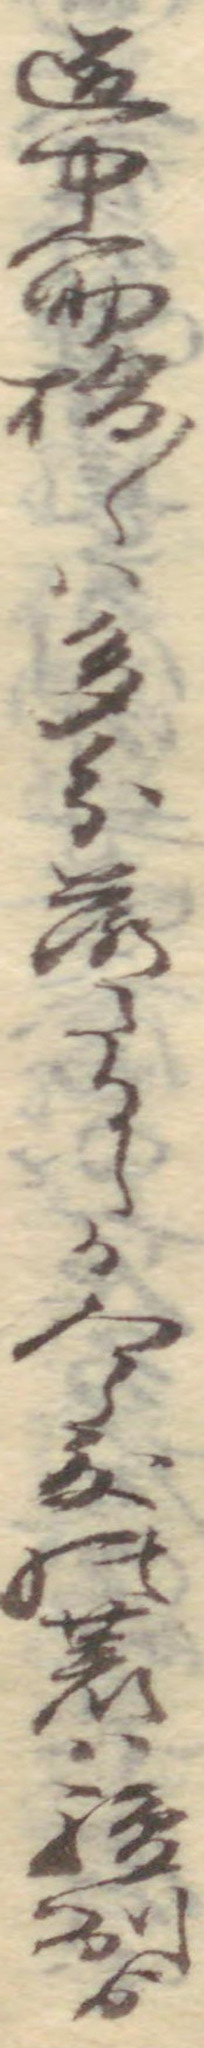道中筋橋々ハ多分落たりしか今度の荒ハ駿州ゟ
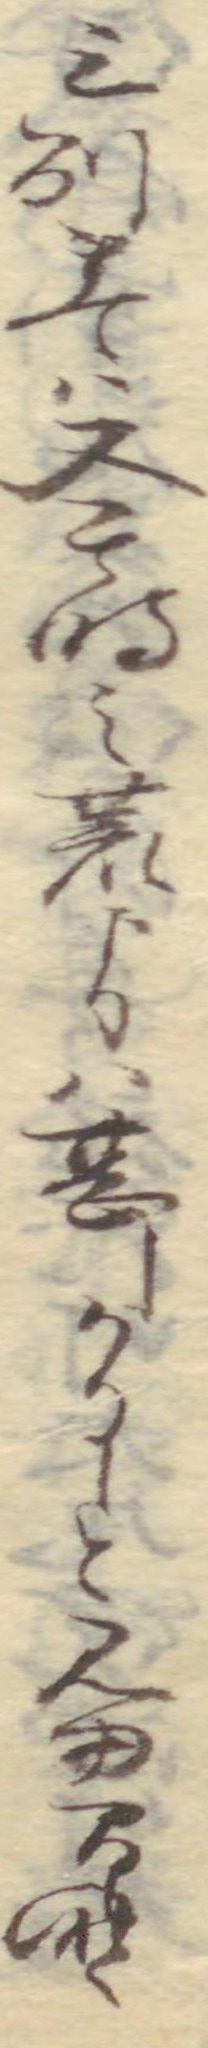三州まてハ又其時之荒よりハ甚しかりしと見ゆ間もなく
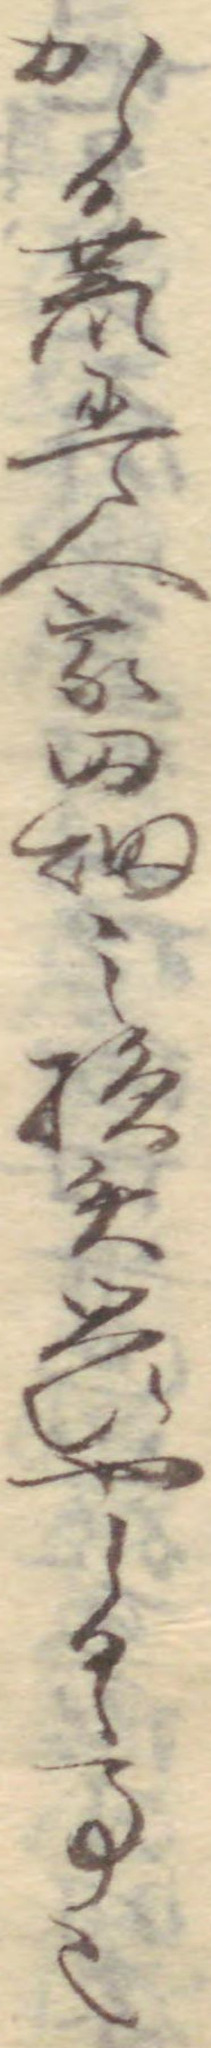かゝる荒にて人家田畑の損失思ひやらるゝ事也
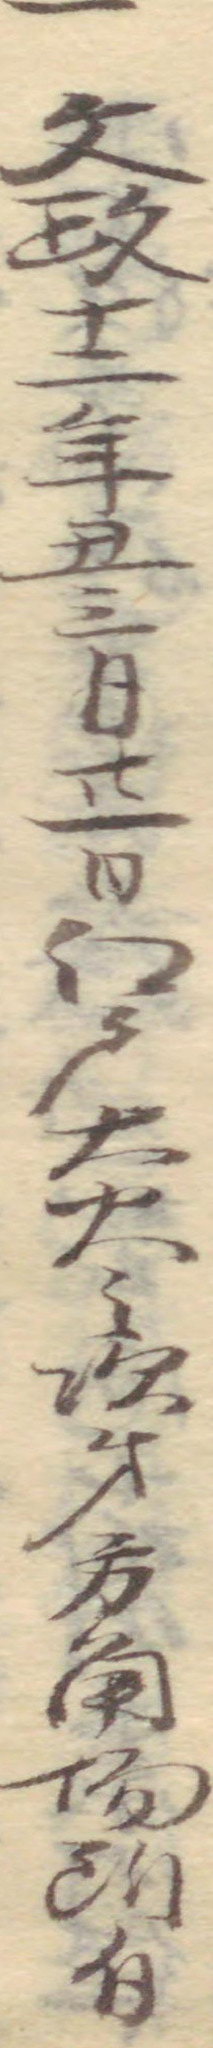一文政十二年丑三月廿一日江戸大火之次第方角場所付
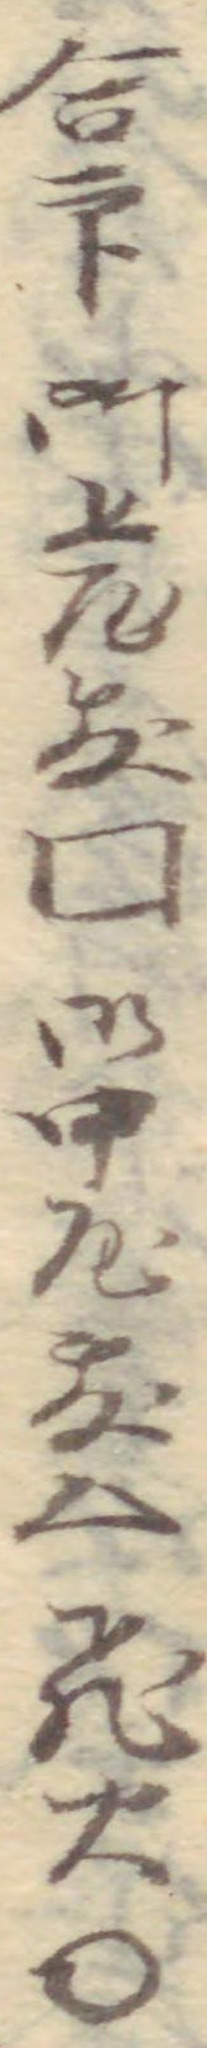合印御上屋敷御中屋敷△飛火〇
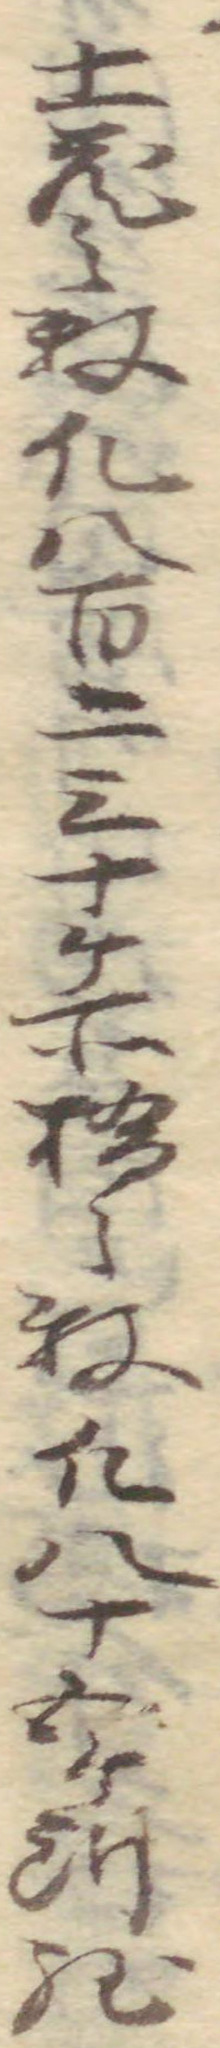土蔵之数凡八百二三十ケ所橋之数凡八十五ケ所程
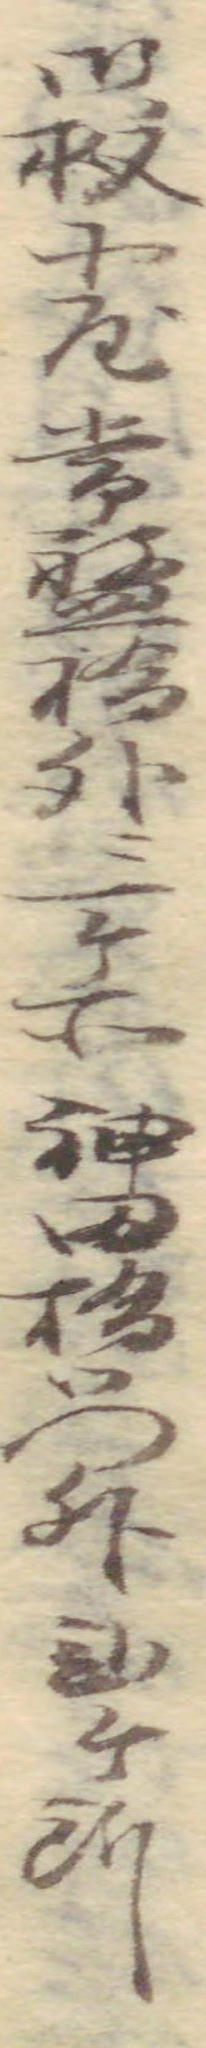御救小屋常盤橋外ニ一ケ所神田橋御門外弐ケ所
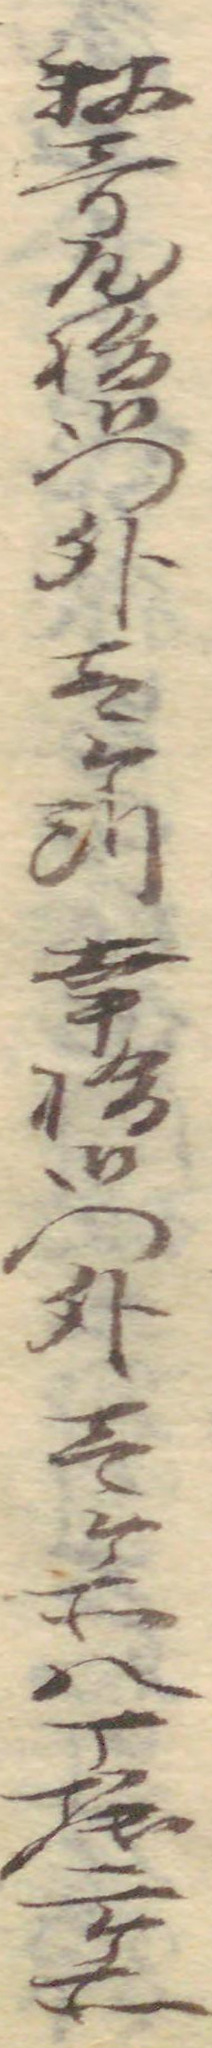数寄屋橋御門外壱ケ所幸橋御門外壱ケ所八丁堀二ケ所
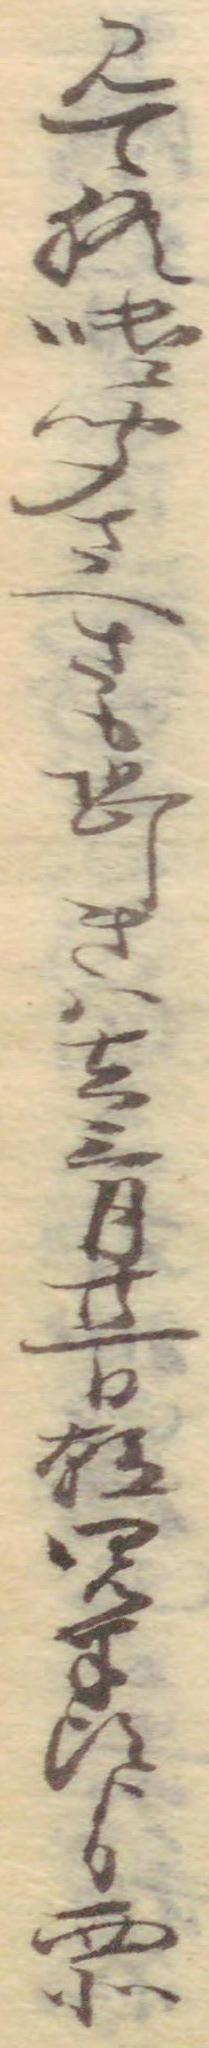見て猶咄ニ聞さへさも恐きハ去三月廿一日朝四ツ半頃より西北

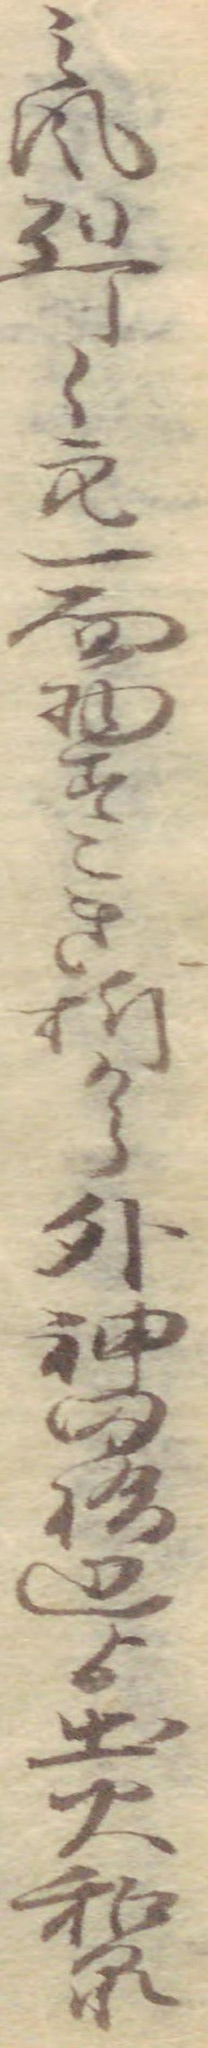之風烈しく空一面物すこき折から外神田橋辺ゟ出火和泉
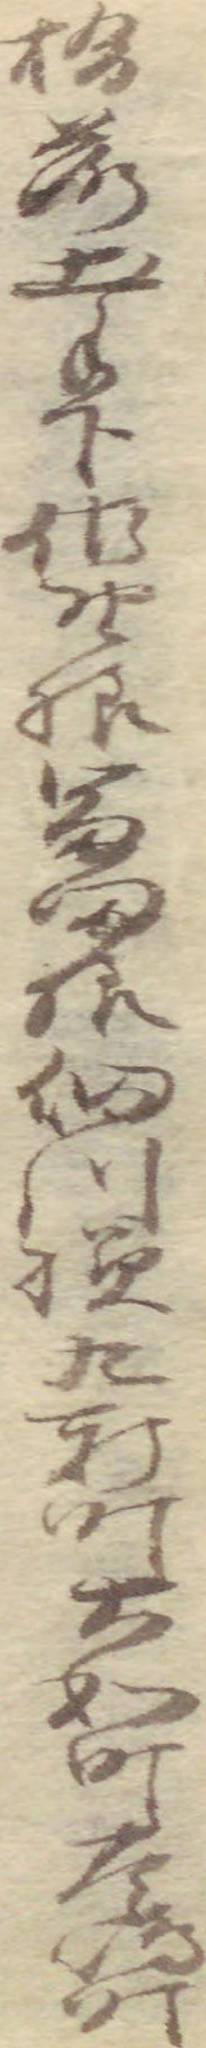橋落土手下佐野様富田様細川様九軒町大和町豊嶋町
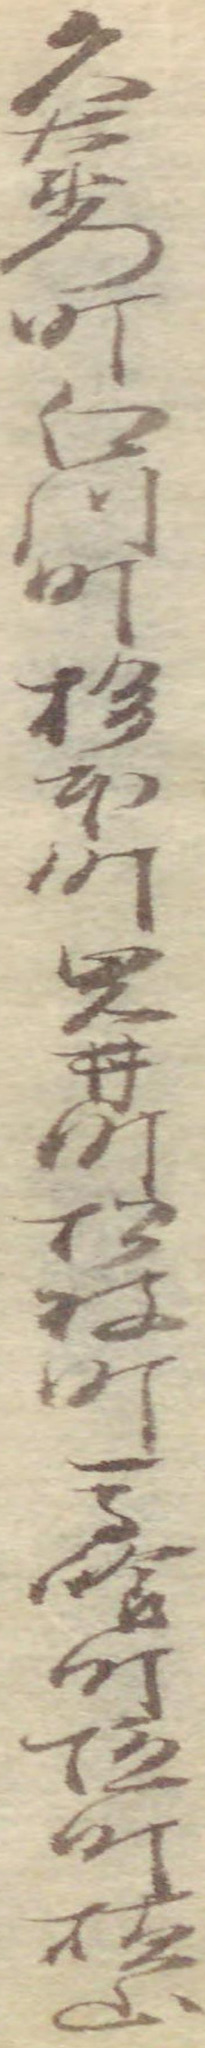久右衛門町白川町橋本町岩井町松枝町馬喰町塩町横山
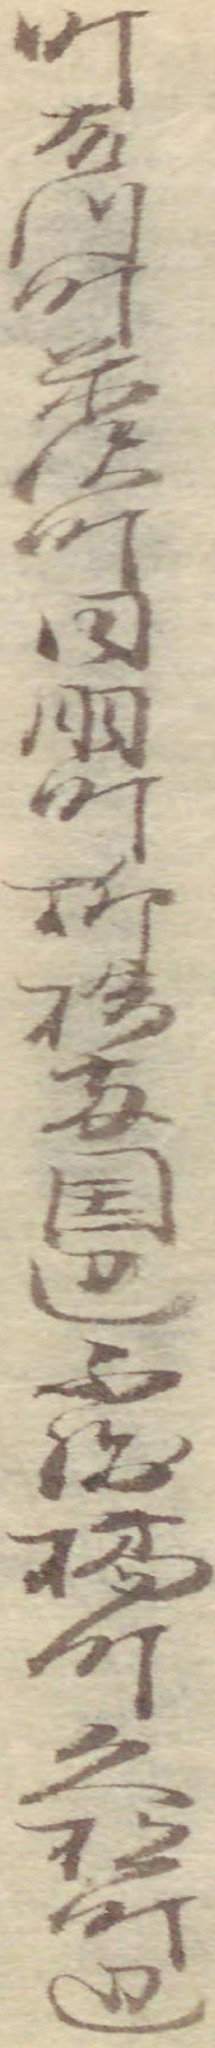町吉川町米沢町同朋町柳橋両国辺不残橘町久松町辺
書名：鶯宿雑記. 巻199-200
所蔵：国立国会図書館 National Diet Library, JAPAN
